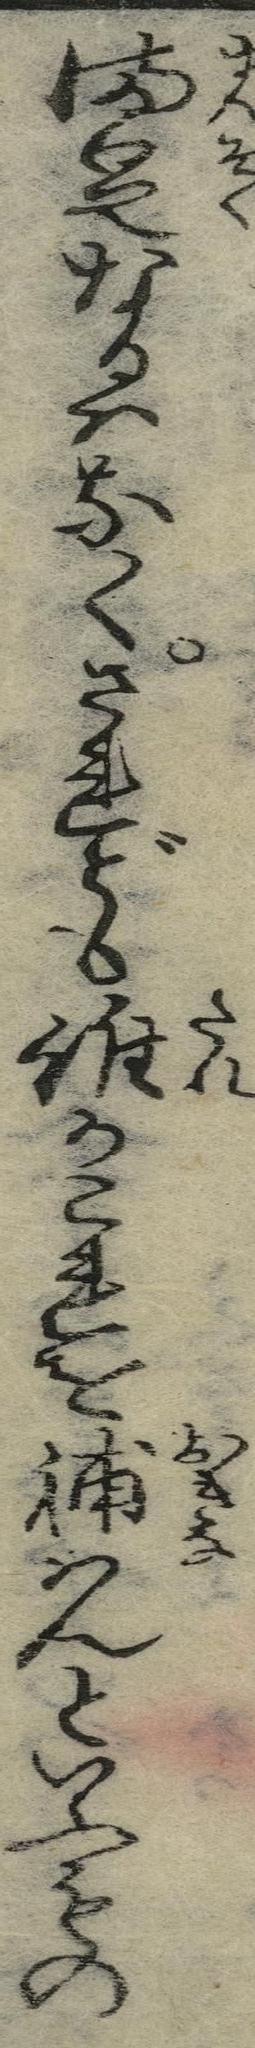満足なるはなく。されども誰かこれを補はんといふもの
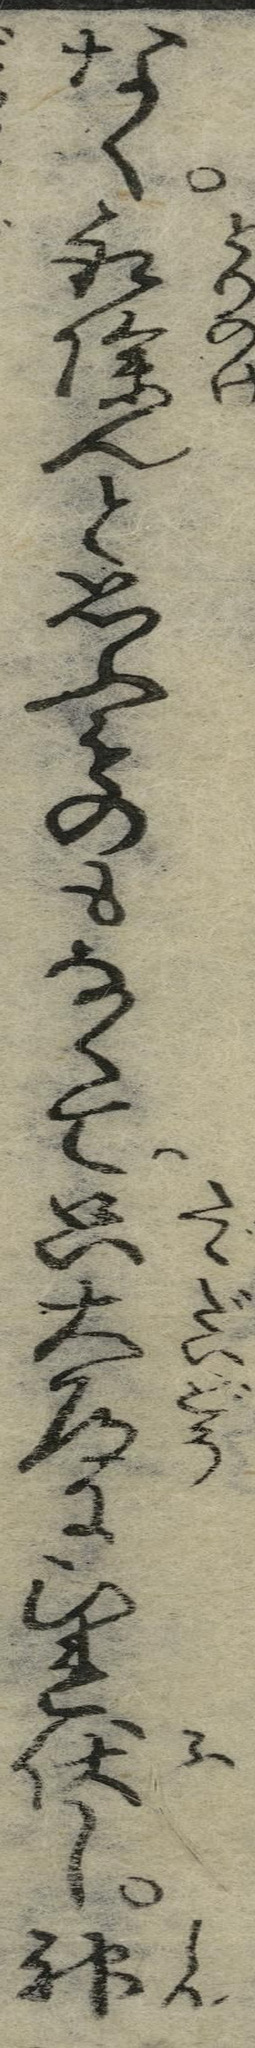なく。取除んと思ふものもなくて。只大道にひれ伏し。神
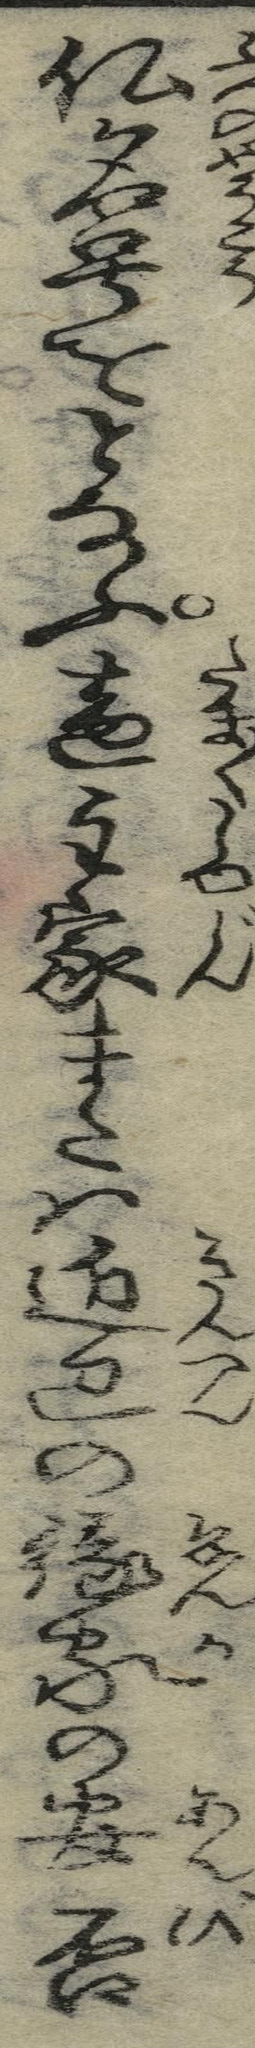仏名号をとなふ。遇主家または近辺の縁家の安否

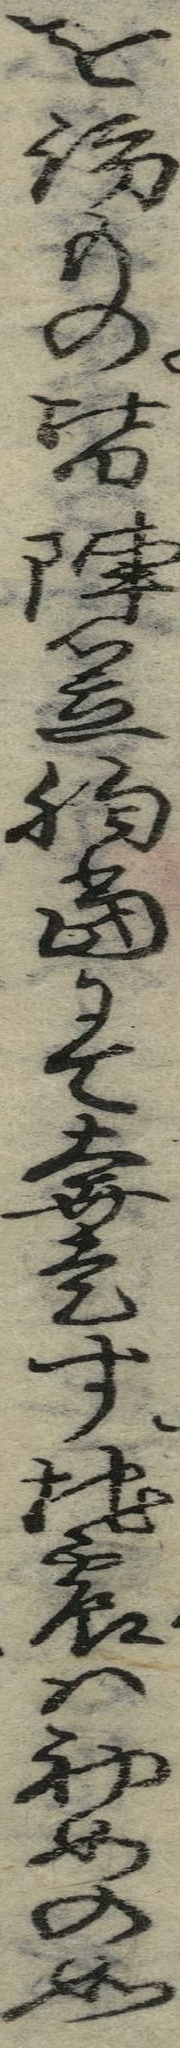を訪もの。皆陣笠胸当にて奔走す。地震は初めの如
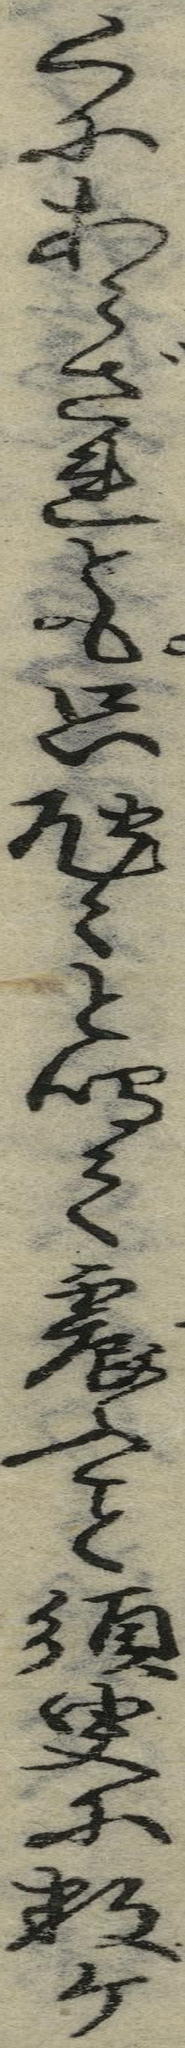くにあらざれとも。只虺々と鳴て震ふこと須臾に数ケ
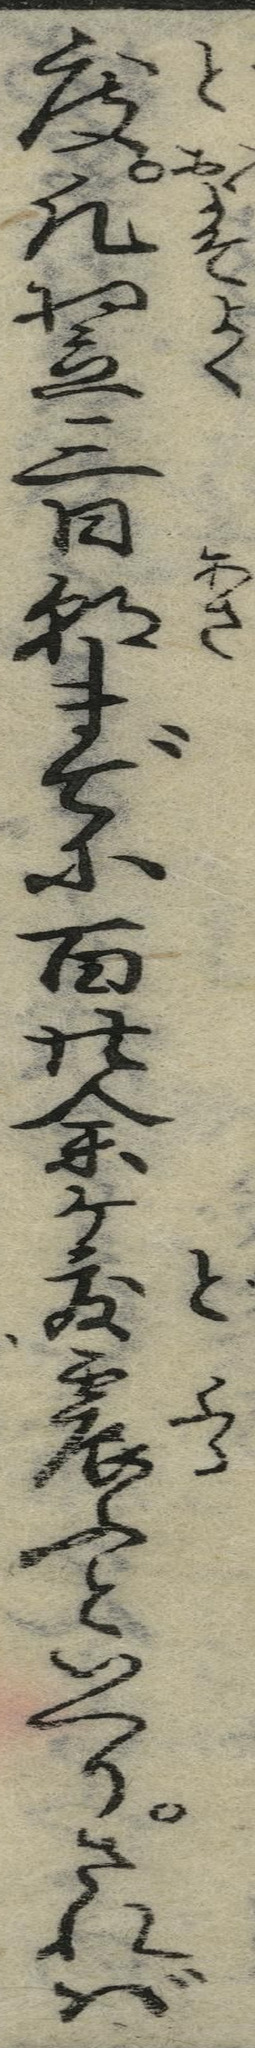度。凡翌三日朝までに百廿余ヶ度震ふといへり。されば
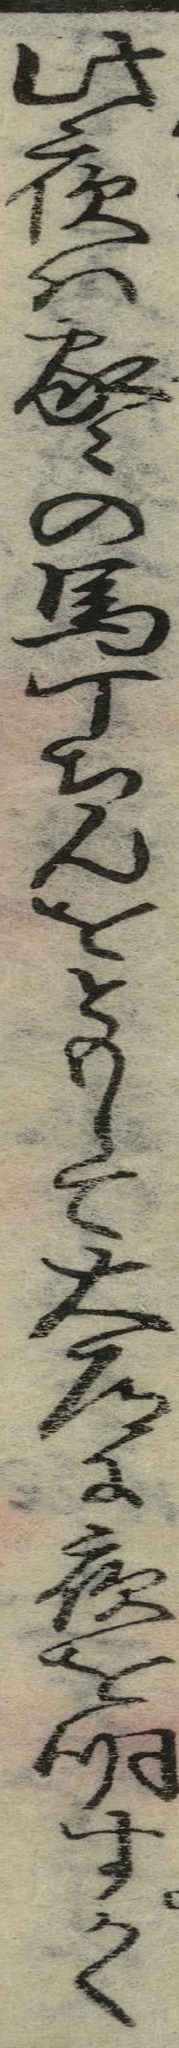此夜は家々の馬丁ちんをともして大道に夜を明す。かく
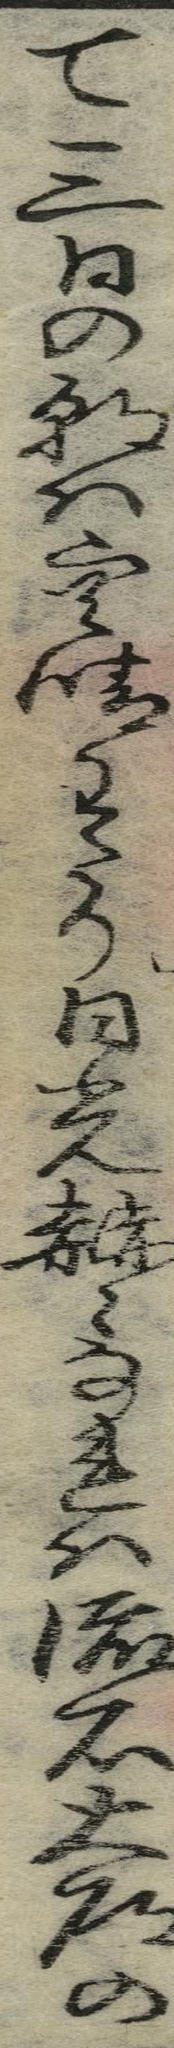て三日の朝は空晴わたり。日光赫々なれば。流石大道の
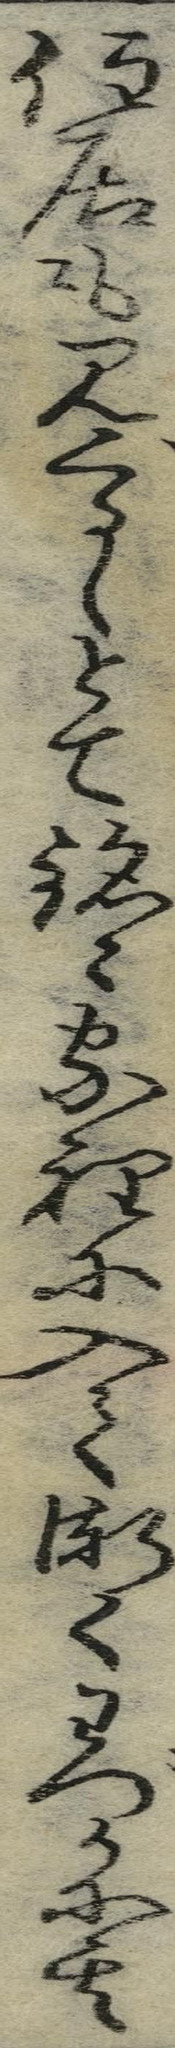住居も見ぐるしとて銘々家裡に入て。漸くわづかに其
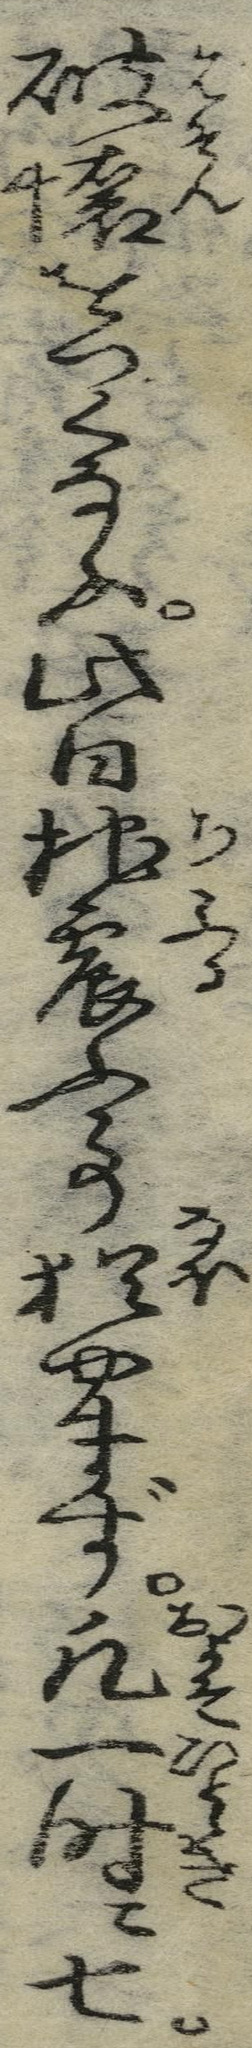破損をつくなふ。此日地震ふ事猶やまず。凡一時に七。
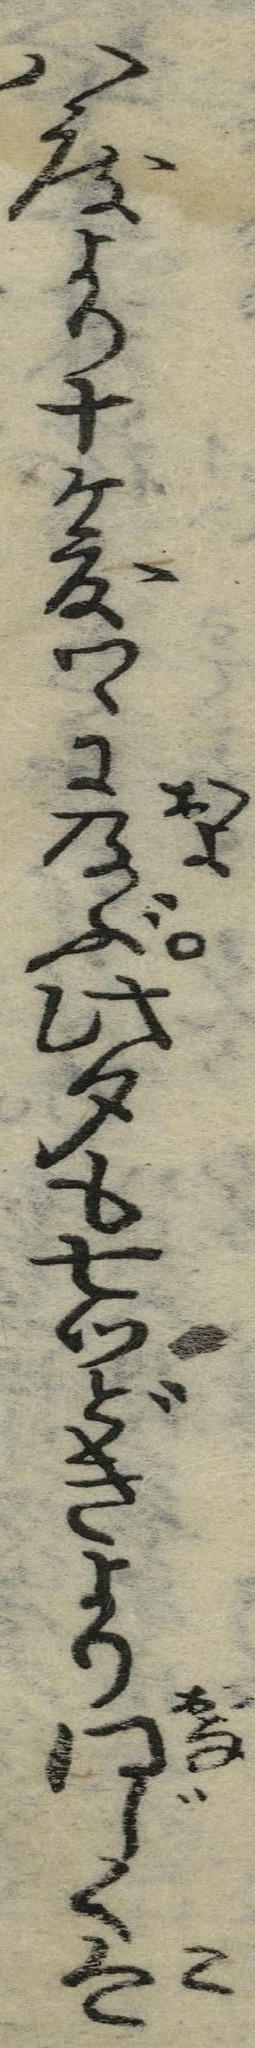八度より十ヶ度つゝに及ぶ。此夕も七ッどきより同じく今
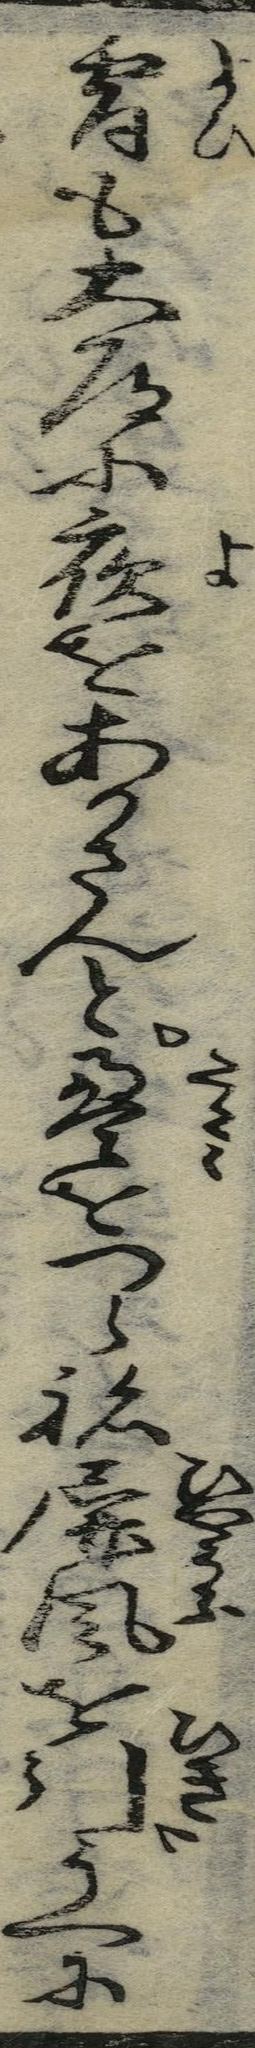宵も大道に夜をあかさんと。畳をつらね屏風を引。うへに
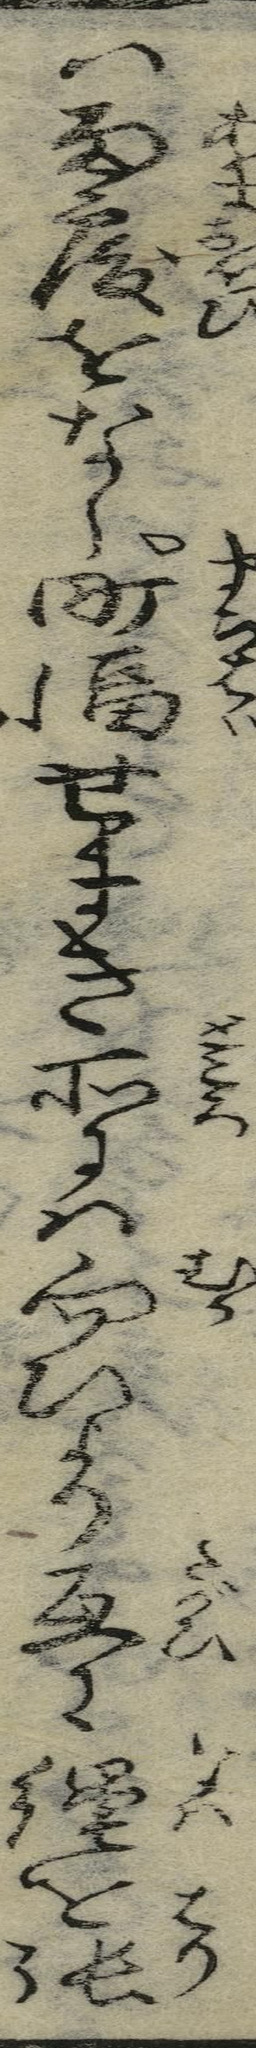は雨覆をなし。町幅せまき所には向ひより互に縄を張
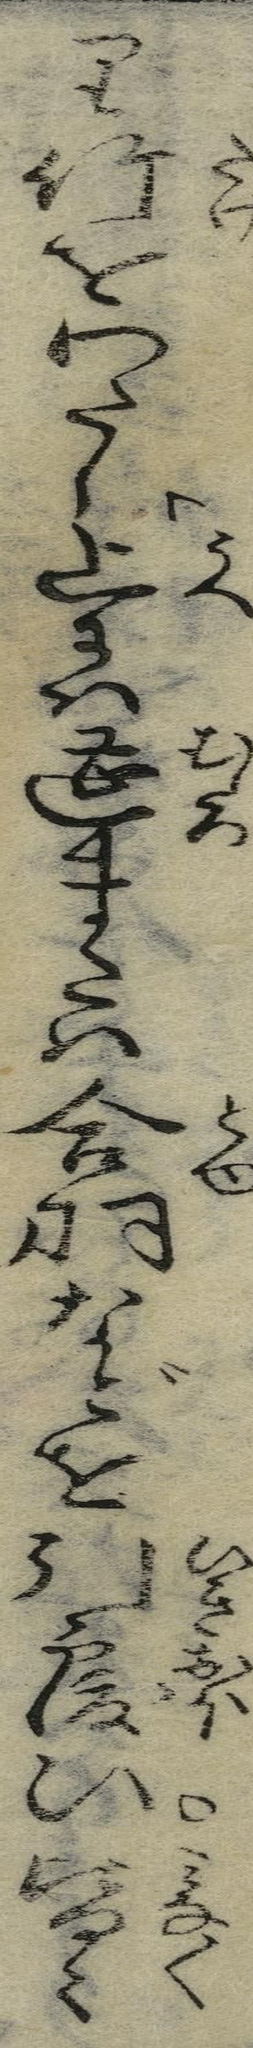り竹をわたし。上には莚または合羽などを引覆ひ。皆々
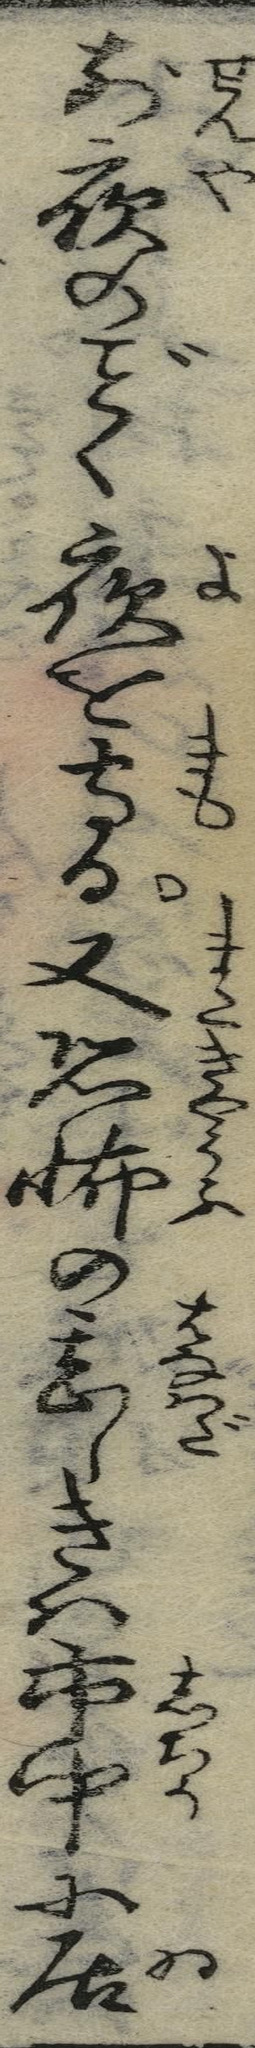前夜のごとく夜を守る。又恐怖の甚しきは市中に居
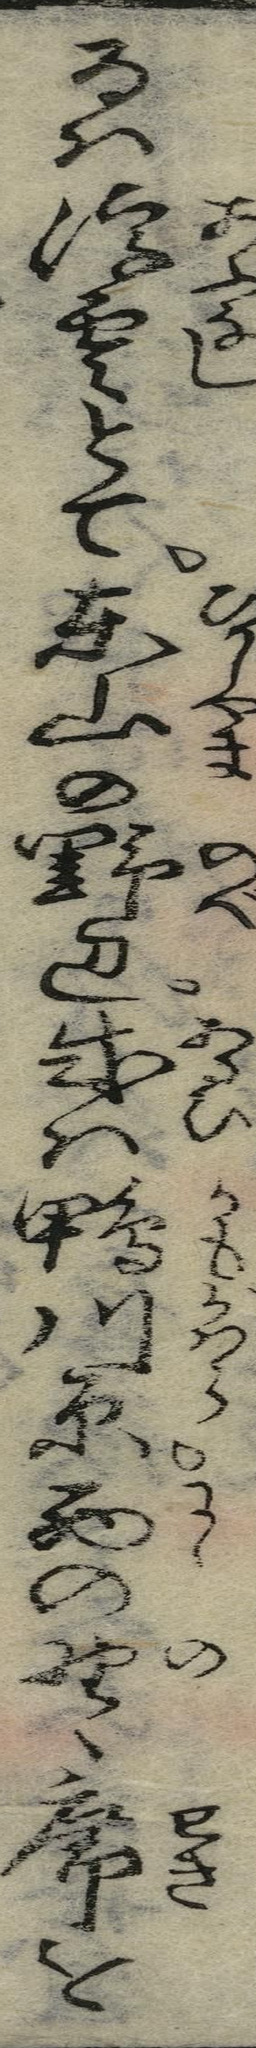るは浮雲とて。東山の野辺。或は鴨川原。西の野ゝの席を
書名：本朝地震記　全
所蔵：東京大学地震研究所図書室 Earthquake Research Institute Library, The University of Tokyo, JAPAN
